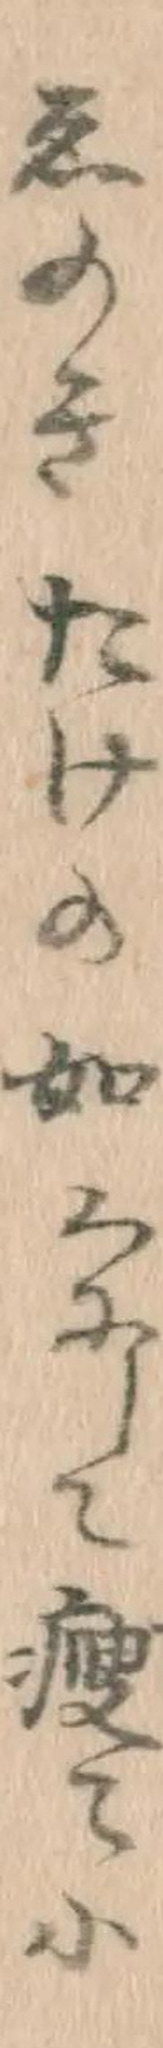ゑのきたけの如くにして瘦て小
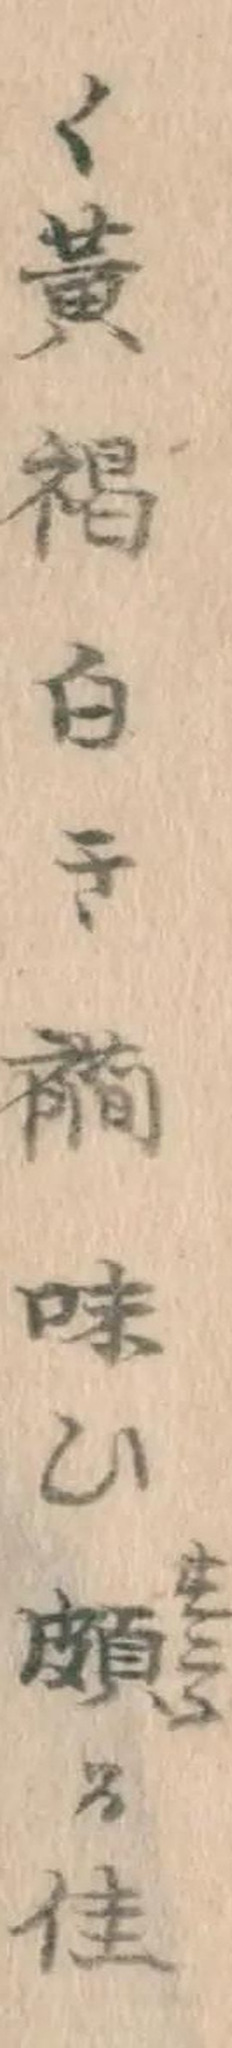く黄褐白き味ひ頗る佳
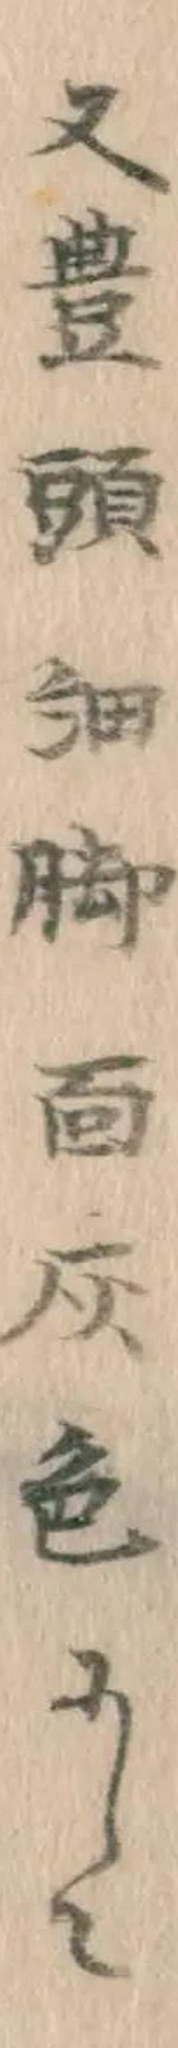又豊頭細脚面灰色にして
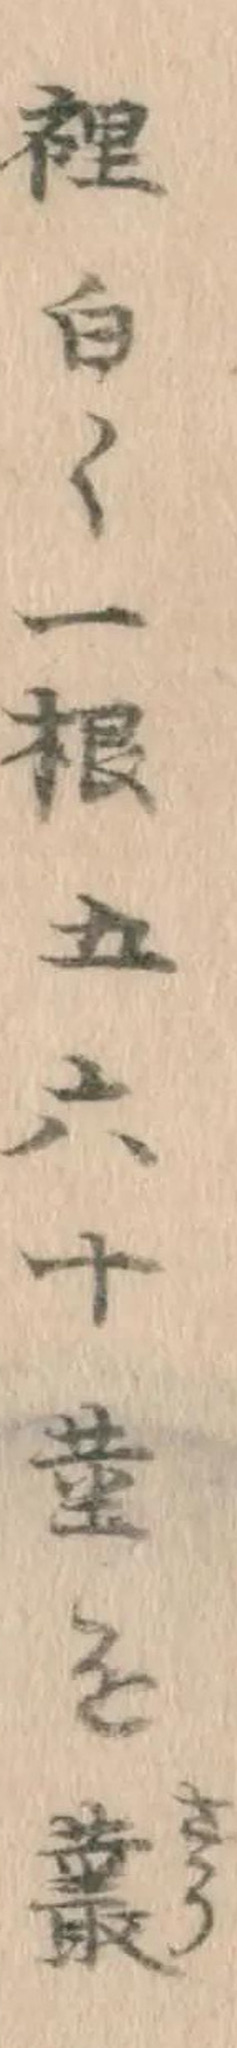裡白く一根五六十茎を叢
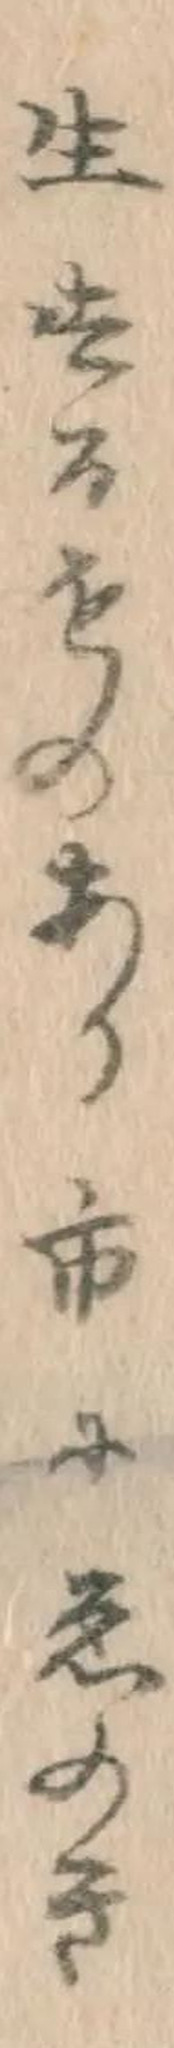生するものあり市にゑのき
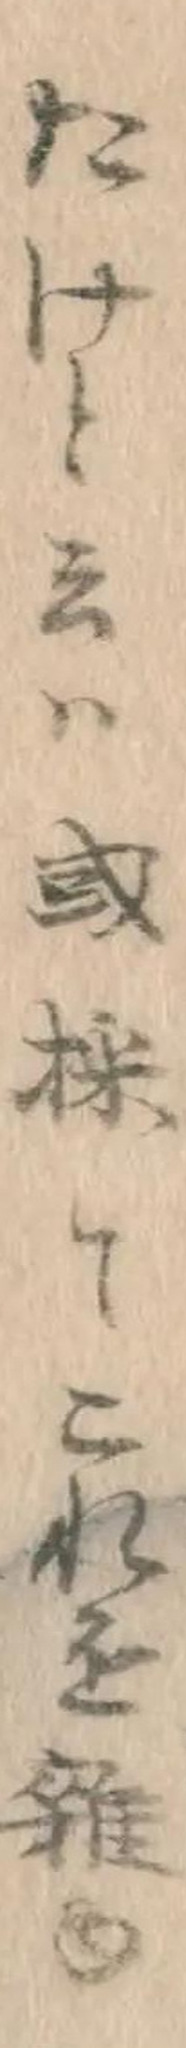たけと云は或採てこれを雑ゆ
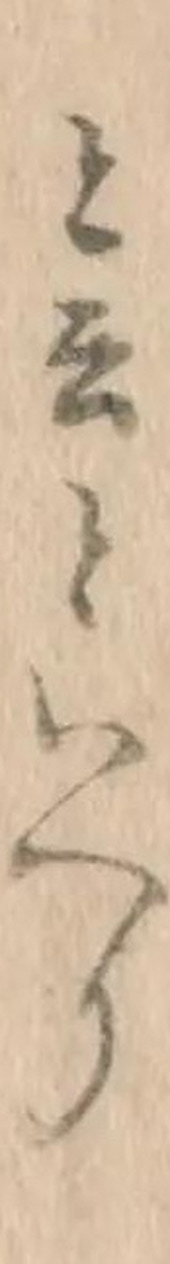と云といへり

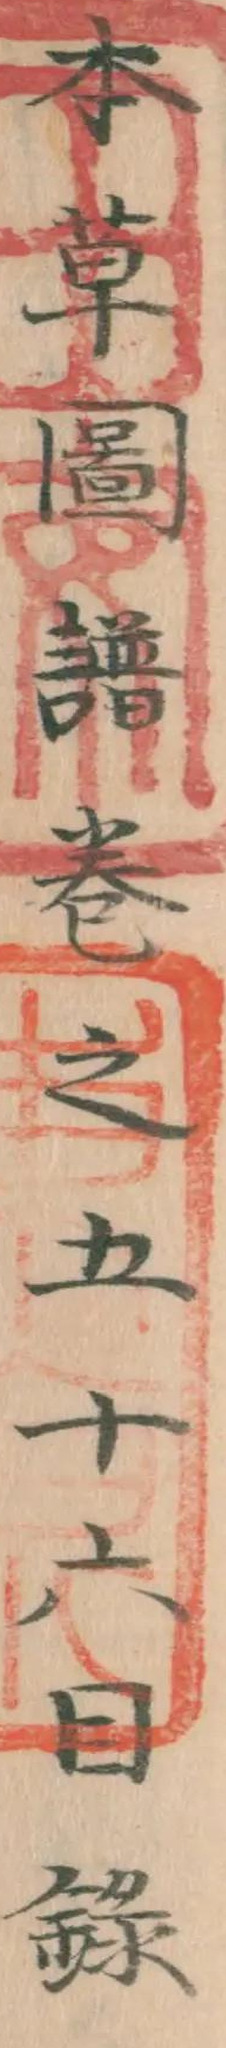本草図譜巻之五十六目録

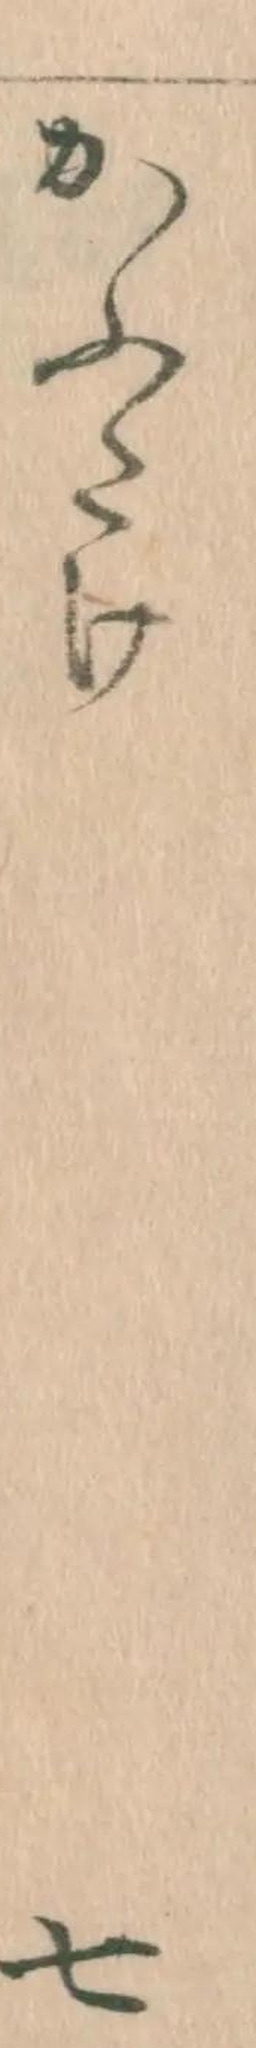かしたけ同
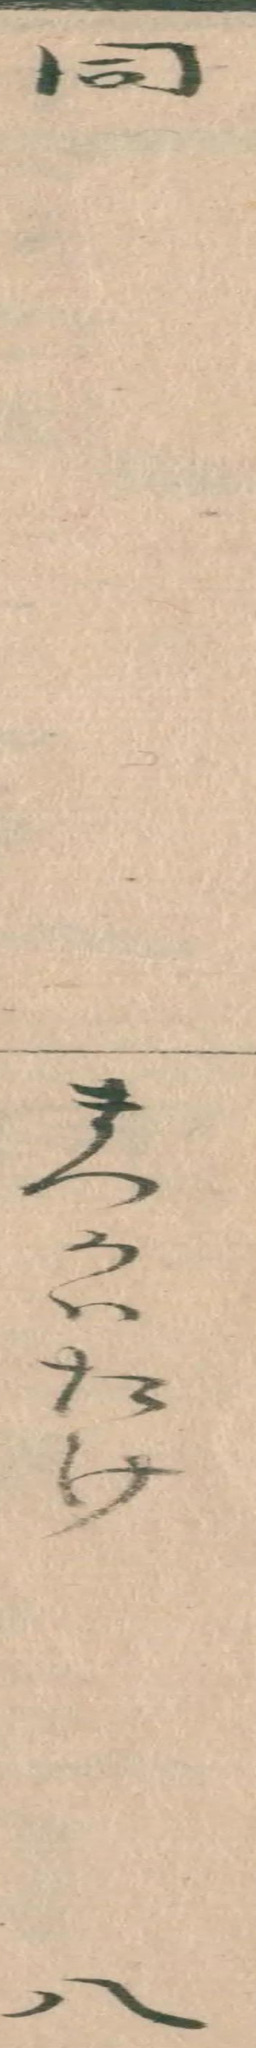同まつかはたけ八
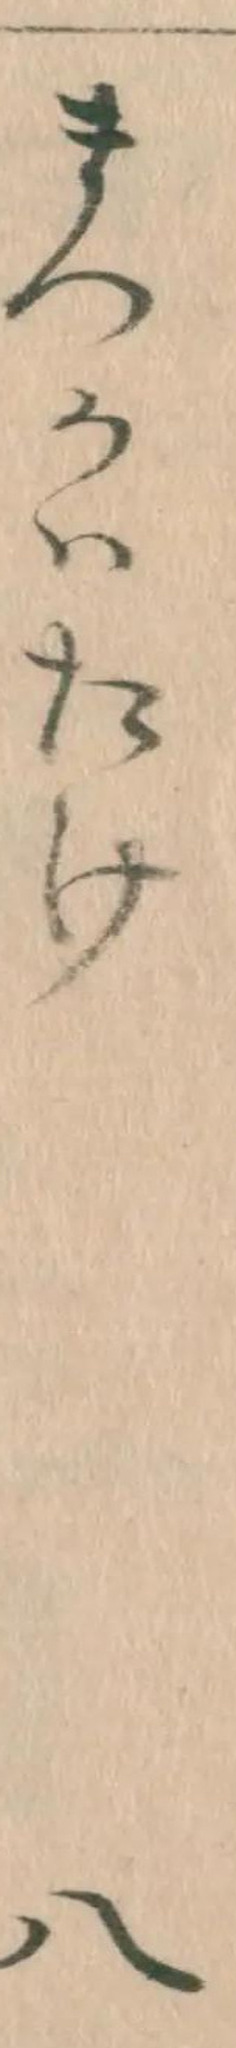同まつかはたけ八
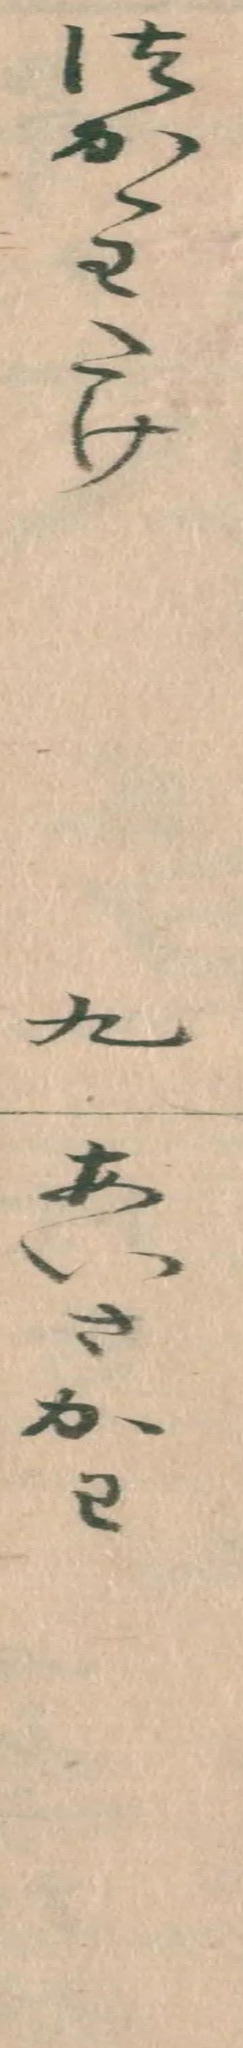つかゝわたけ九あいさかわ
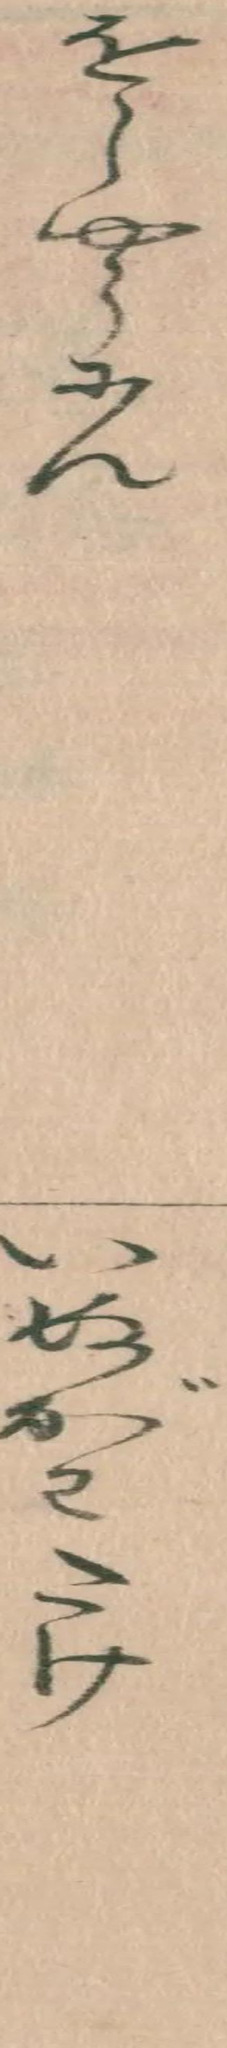をしやうにんいぬがわたけ十一
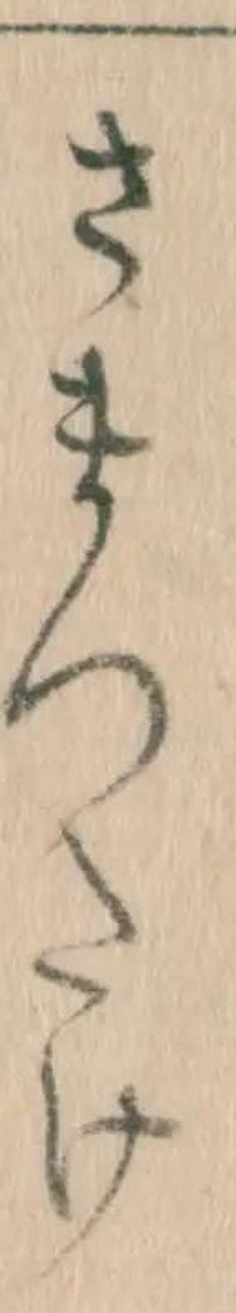さまつ十八

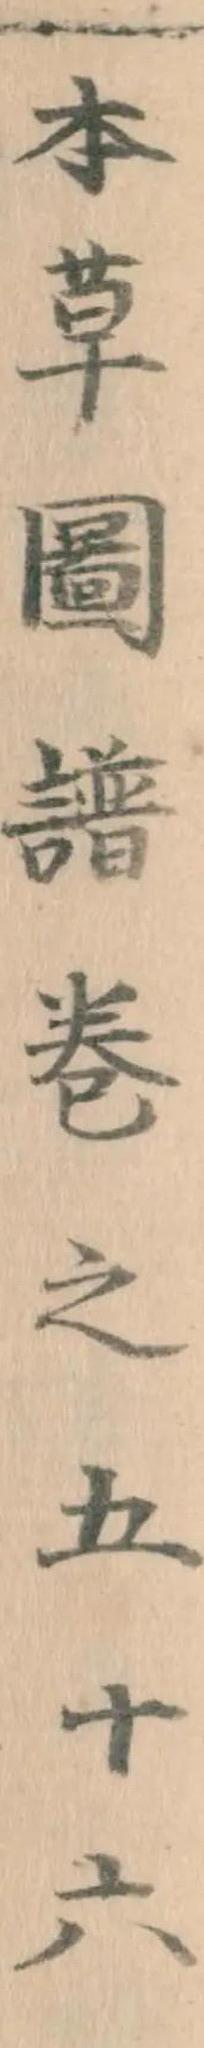本草図譜巻之五十六
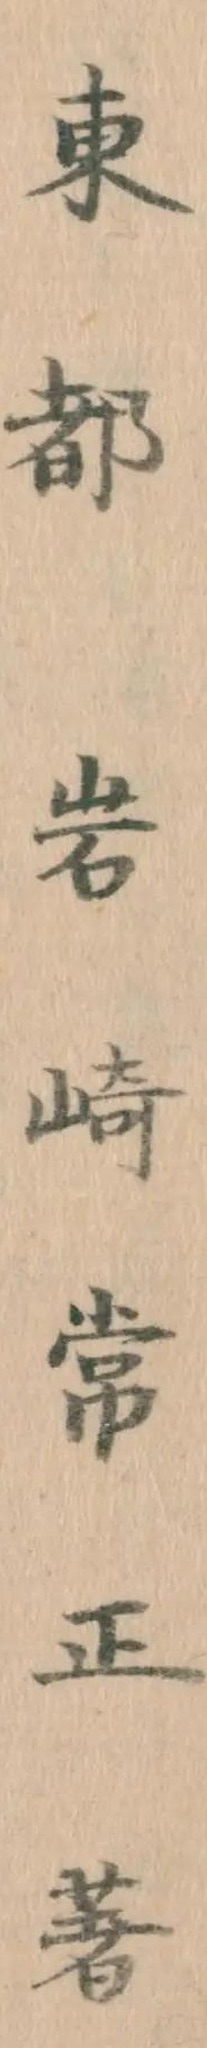東都岩崎常正著
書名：本草図譜. 巻55-57
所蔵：国立国会図書館 National Diet Library, JAPAN
